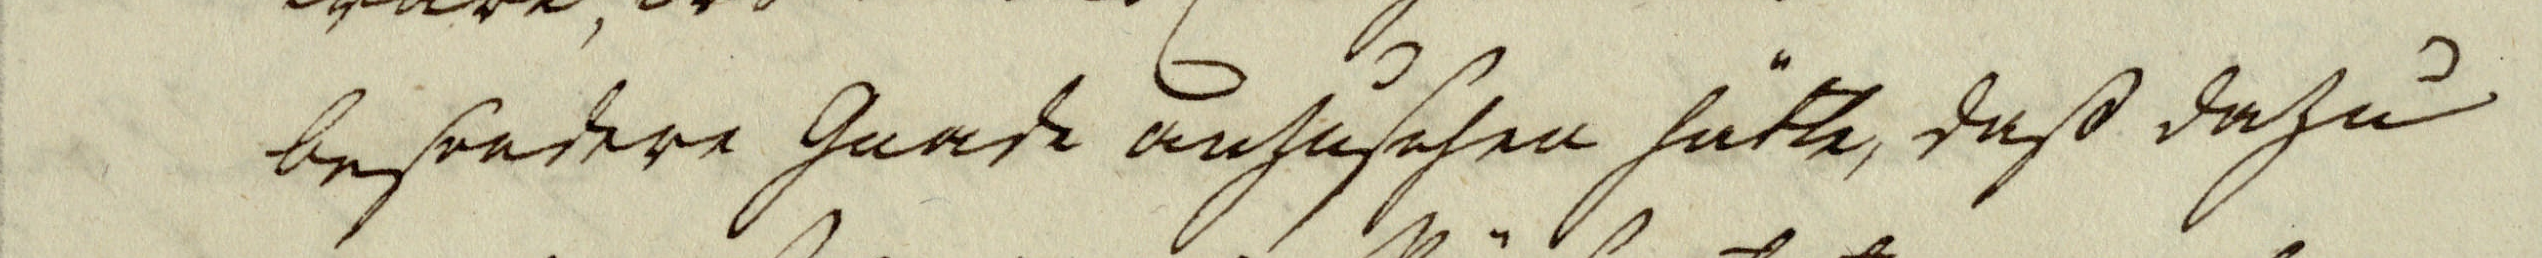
besondere Gnade anzusehen hätte, daß dazu
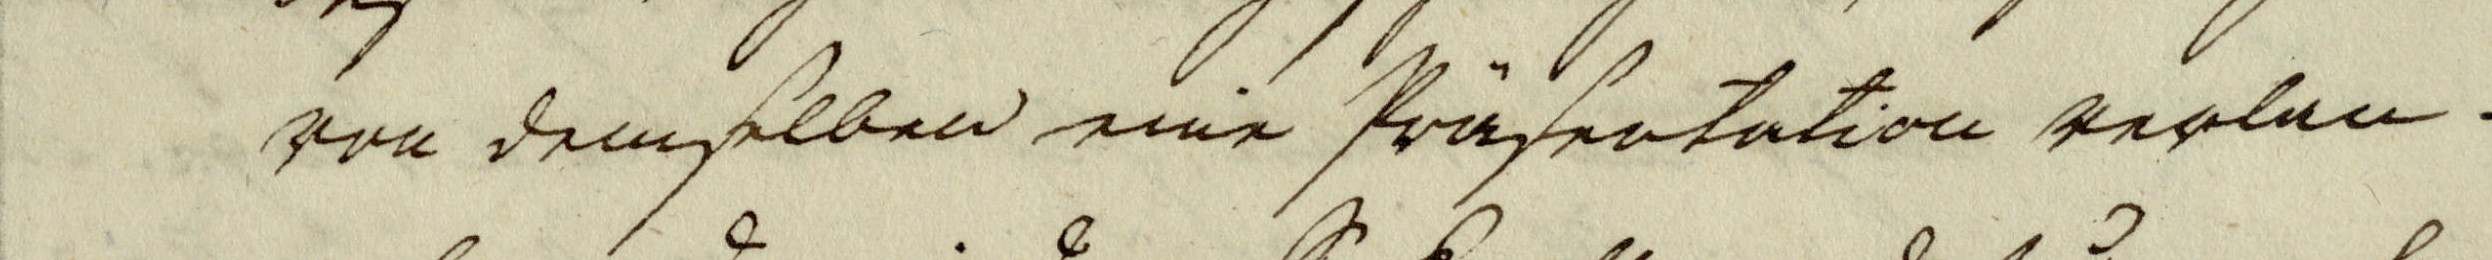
von demselben eine Präsentation verlan¬
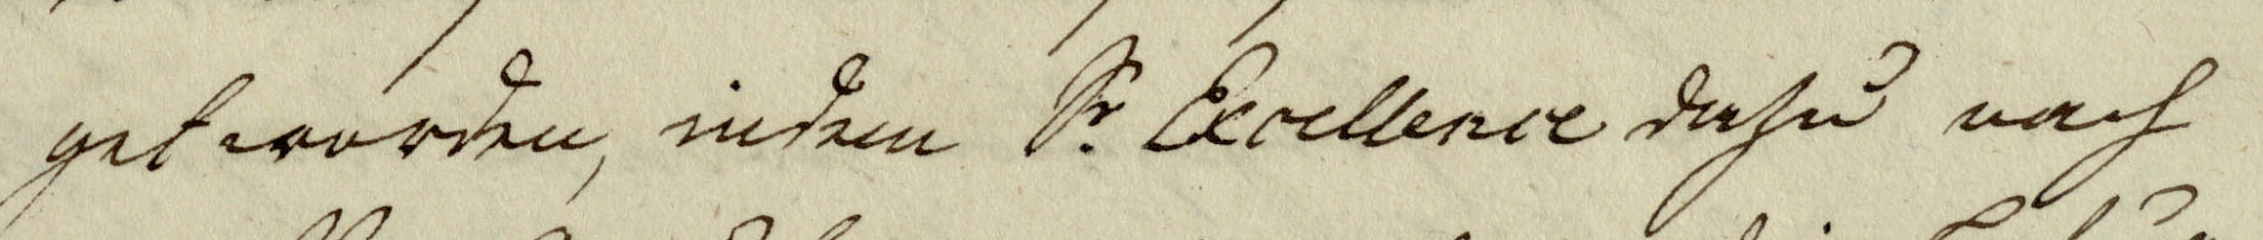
get worden, indem Sr. Excellence dazu nach
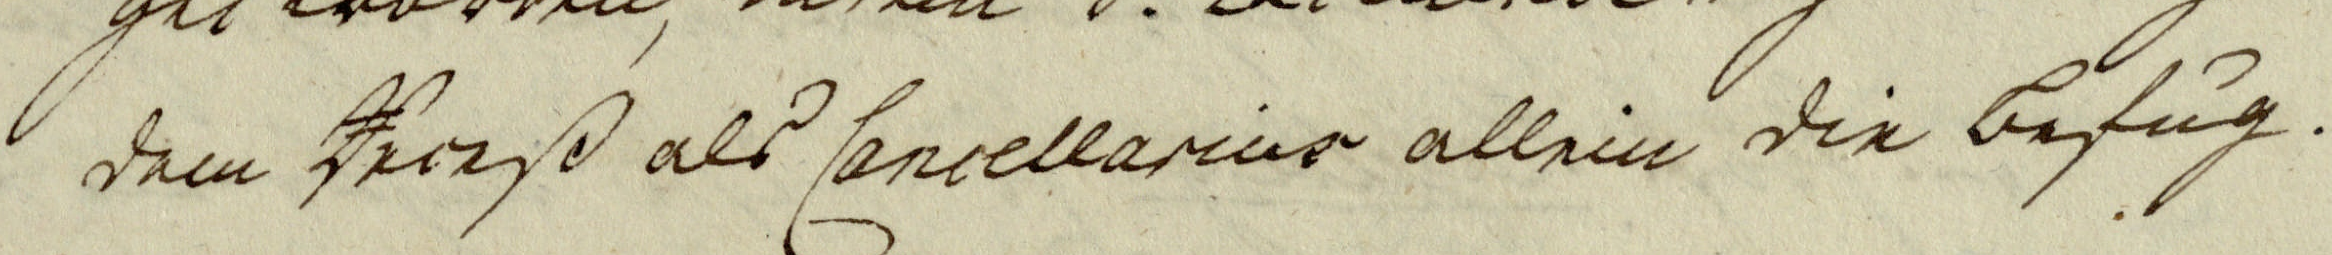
dem Receß als Cancellarius allein die Befug¬
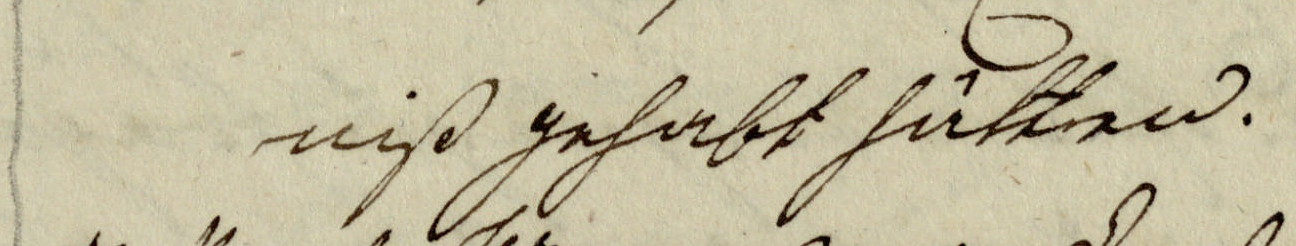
niß gehabt hätten.
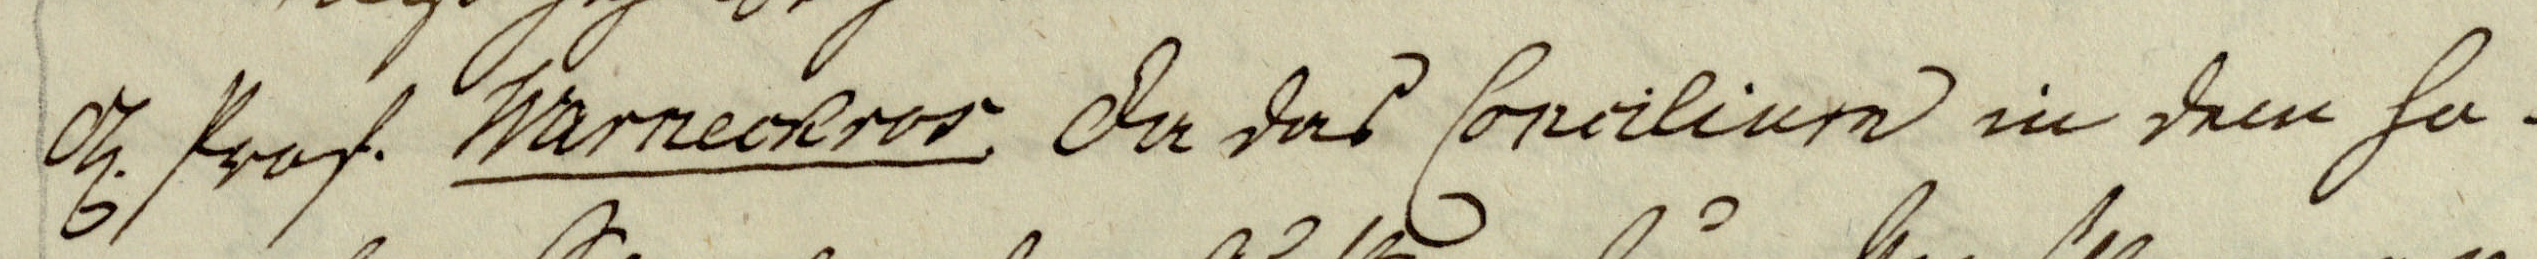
dh. Prof. Warneckros. Da das Concilium in dem ho¬
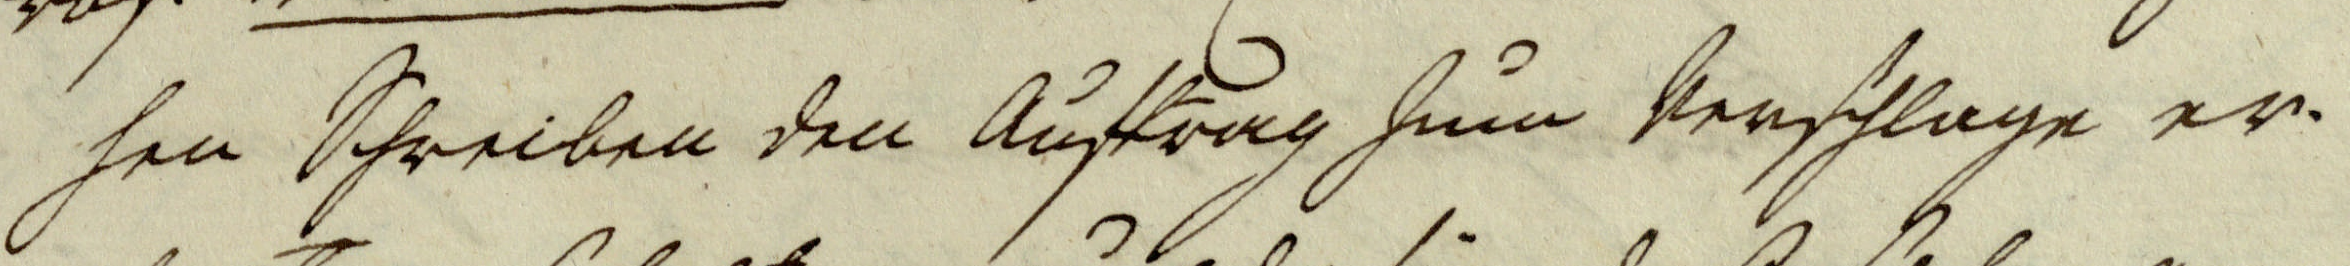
hen Schreiben den Auftrag zum Vorschlage er¬
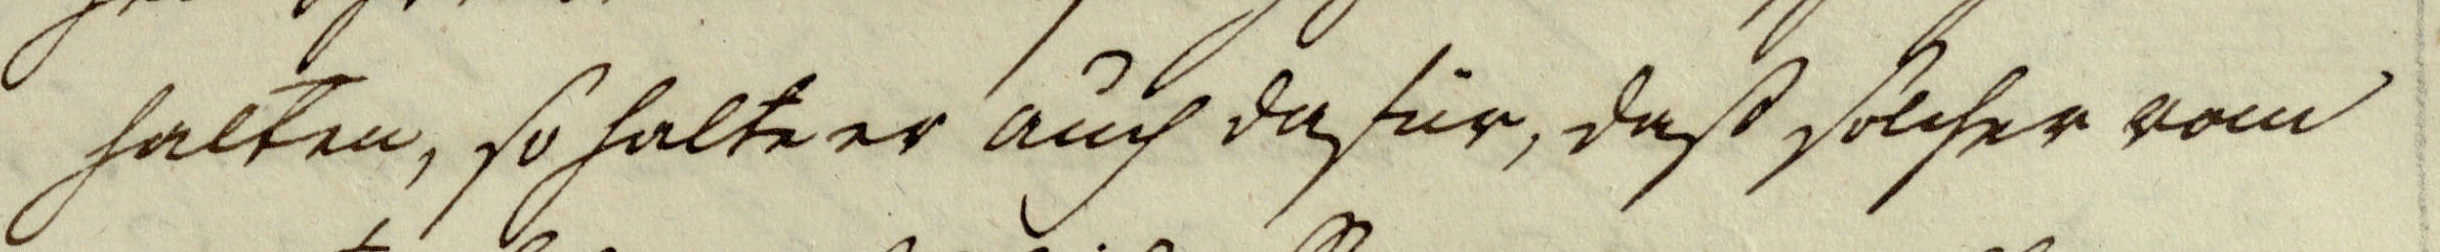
halten, so halte er auch dafür, daß solcher vom
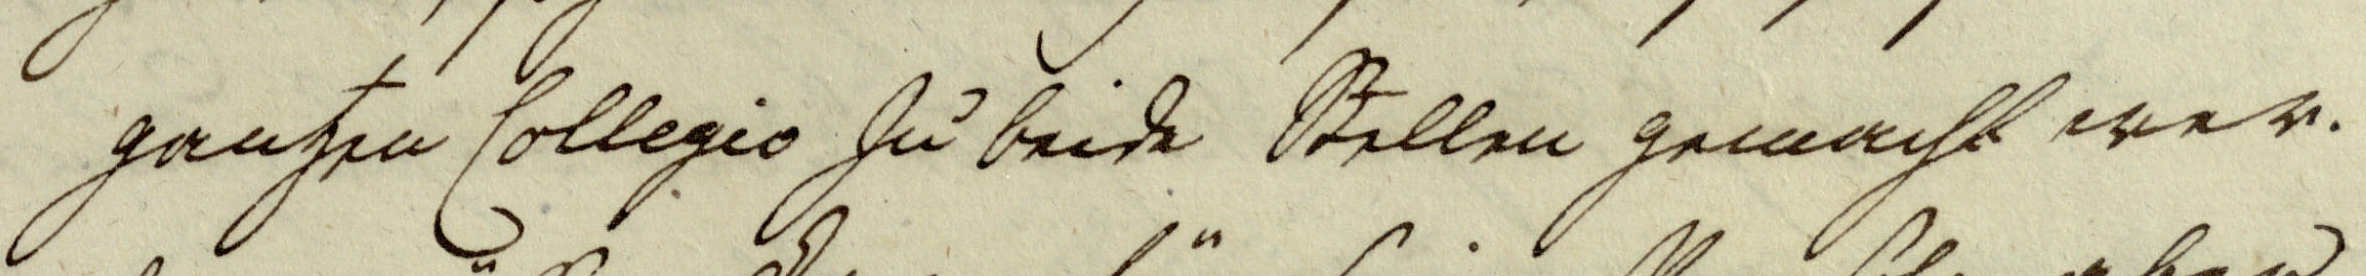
gantzen Collegio zu beide Stellen gemacht wer¬
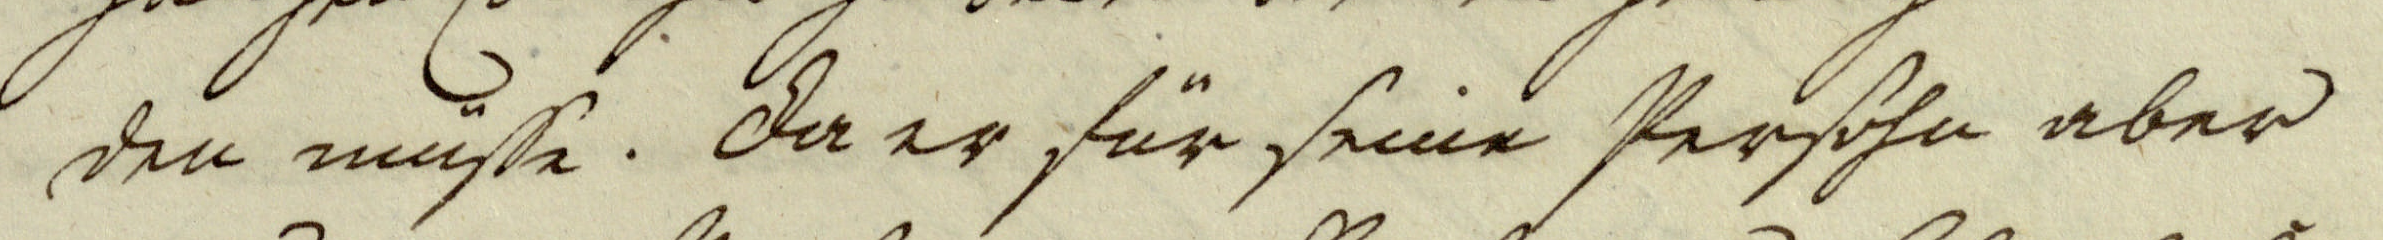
den müsse. Da er für seine Persohn aber
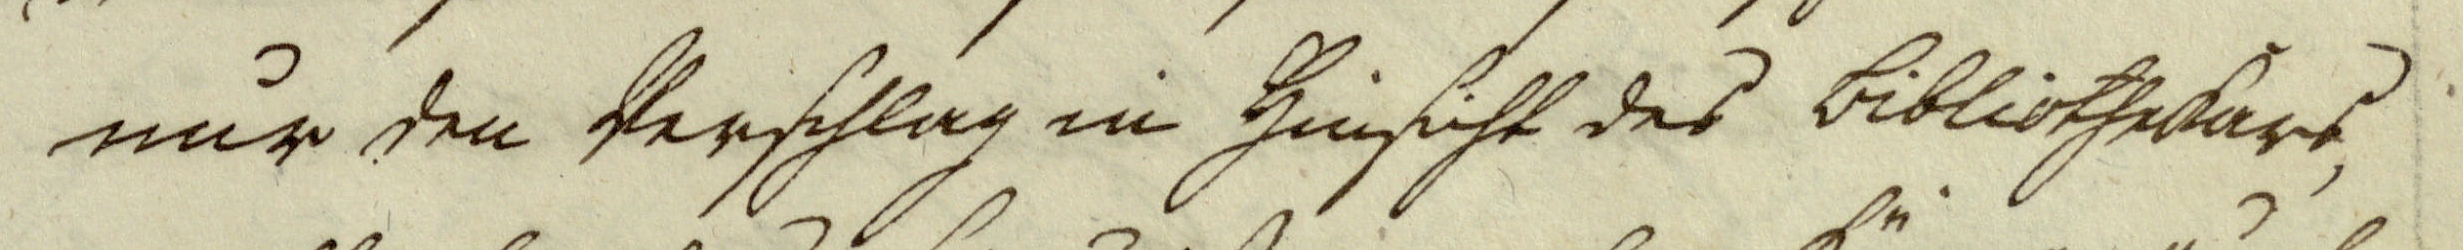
nur den Vorschlag in Hinsicht des Bibliothekars,
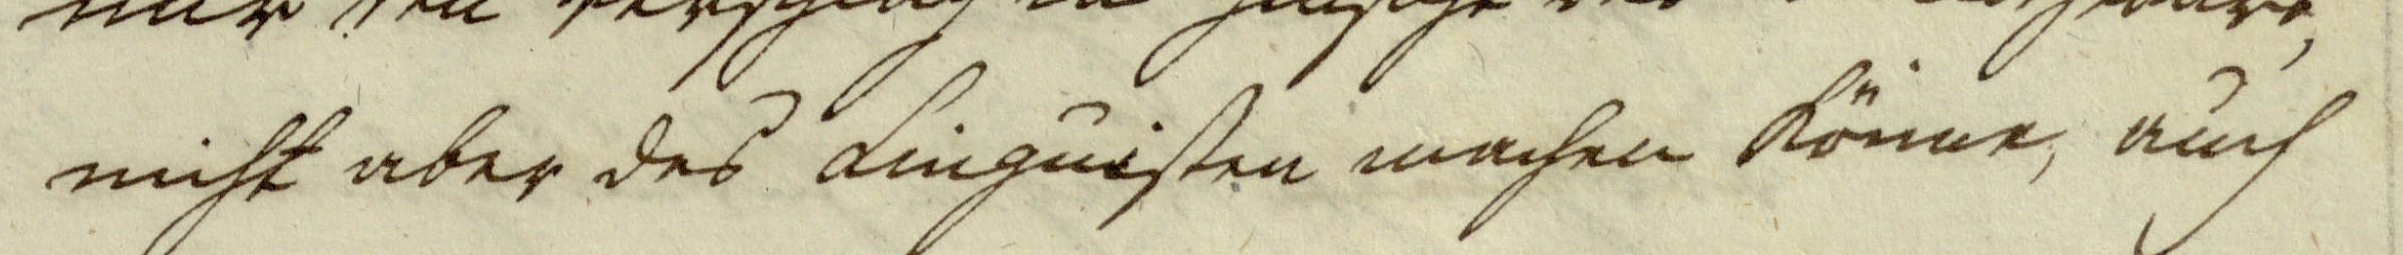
nicht aber des Linguisten machen könne, auch
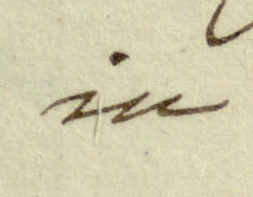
in
